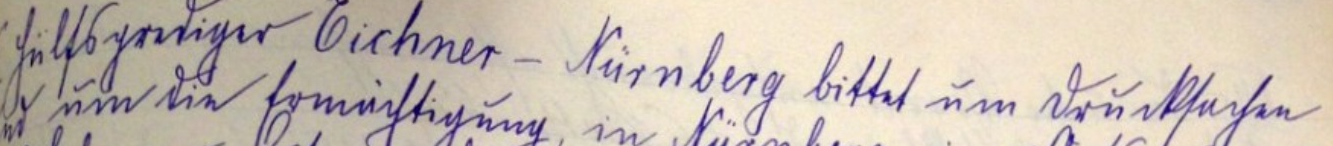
V Hülfsprefiger Eichner – Nürnberg bittet um Drucksachen
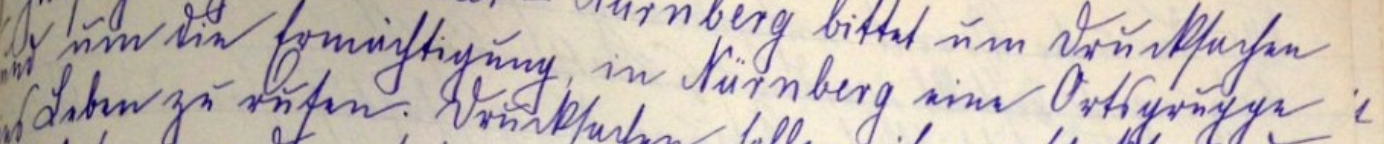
und um die Ermächtigung in Nürnberg eine Ortsgruppe
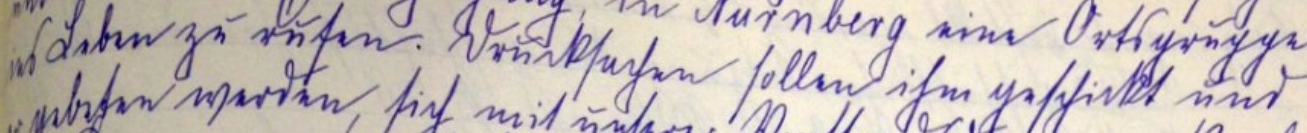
ins Leben zu rufen. Drucksachen sollen ihm geschickt und
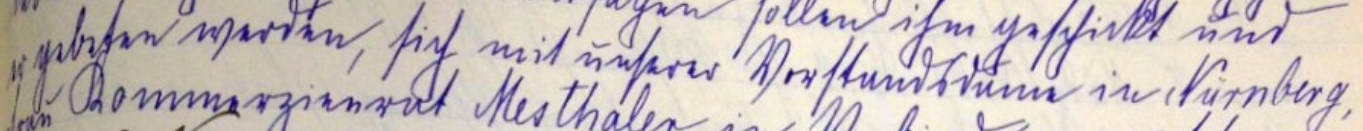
er gebeten werden, sich mit unserer Vorstandsdame in Nürnberg
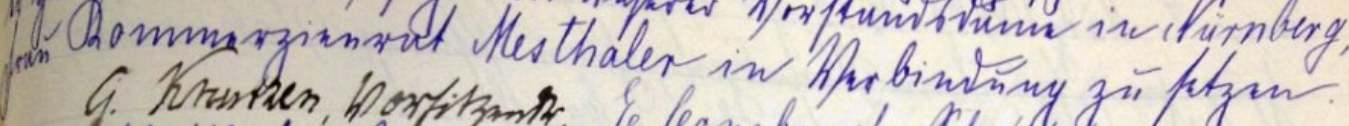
Frau Kommerzienrat Mesthaler in Verbindung zu setzen.
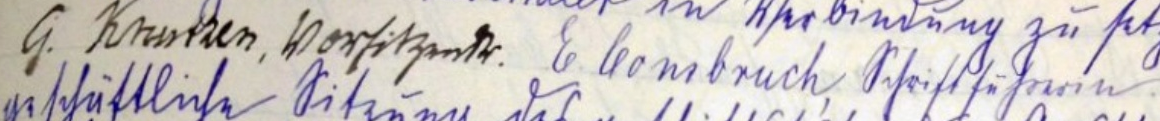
G. Knutzen Vorsitzende E. Consbruck Schriftführerin
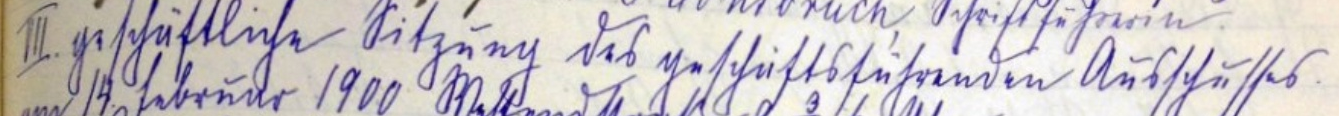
VII . geschäftliche Sitzung des geschäftsführenden Ausschusses
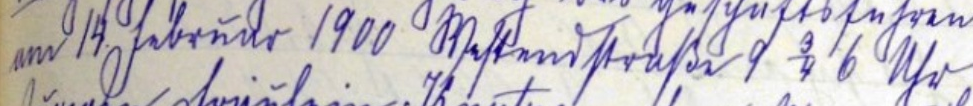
am 19. Februar 1900 Westendstraße 9 ¾6 Uhr
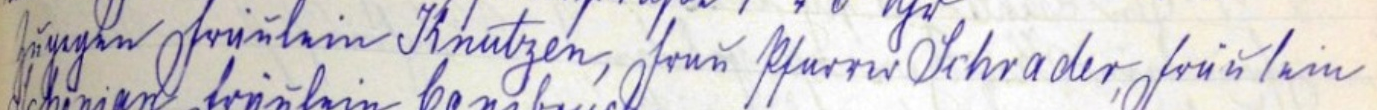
Zugegen: Fäulein Knutzen, Frau Pfarrer Schrader, Fräulein
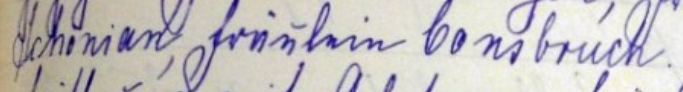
Schönian, Fräulein Consbruck
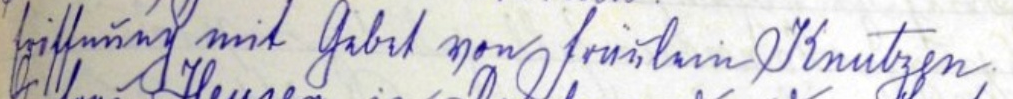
Eröffnung mit Gebet von Fräulein Knutzen
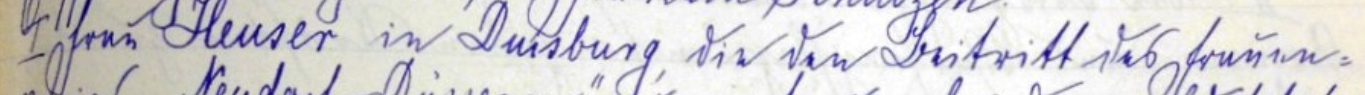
I Frau Heuser in Duisburg, die den Beitritt des Frauen
